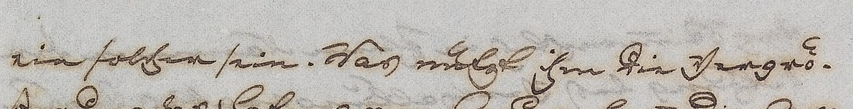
ein solcher sein. Was nützt ihm die Vergrö-
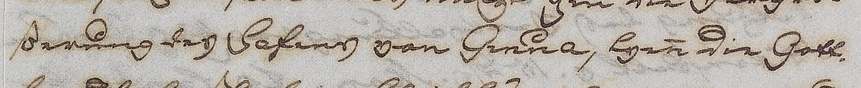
ßerung des Hafens von Genua, wenn die Gott-
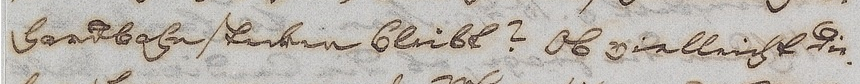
hardbahn stecken bleibt? Ob vielleicht die-
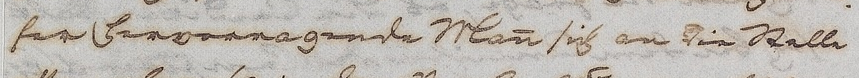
ser hervorragende Mann sich an die Stelle
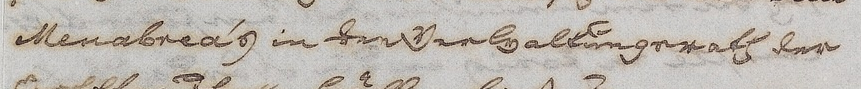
Menabrea's in den Verwaltungsrath der
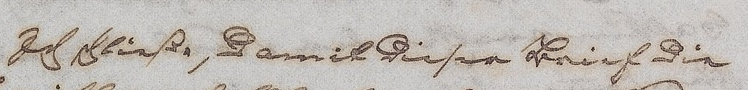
Ich schließe, damit dieser Brief die
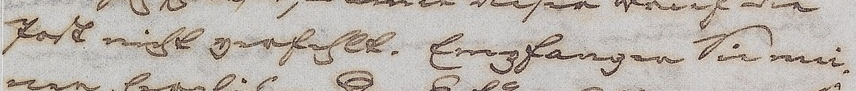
Post nicht verfehlt. Empfangen Sie mei-
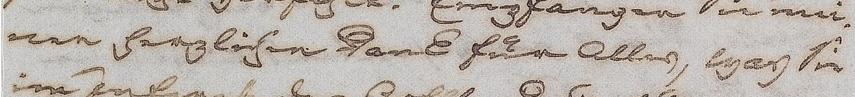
nen herzlichen Dank für alles, was Sie
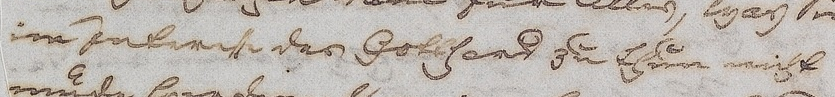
im Interesse des Gotthard zu thun nicht
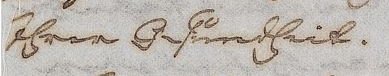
Ihrer Gesundheit.
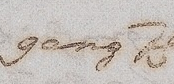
ganz Ihr
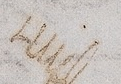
Escher
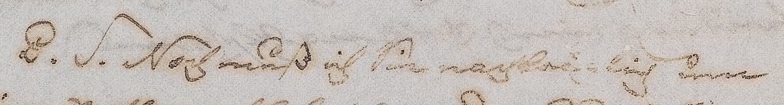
P. S. Noch muss ich Sie nachträglich um
